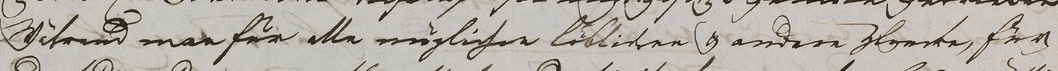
Während man für alle möglichen löblichen & andern Zwecke, für
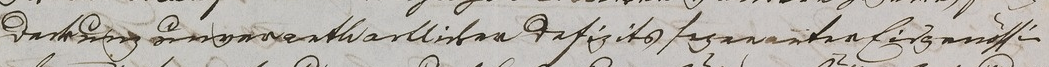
Deckung unverantwortlicher Defizits sogenannter Eidgenössi-
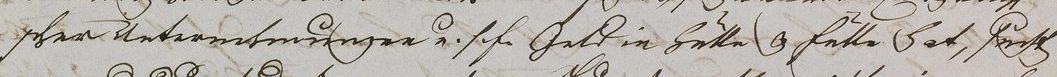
scher Unternehmungen u. s. f. Geld in Hülle & Fülle hat, sucht
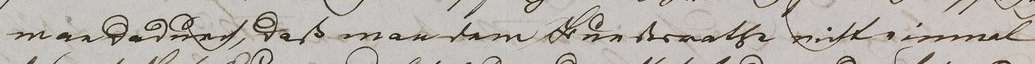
man dadurch, daß man dem Bundesrathe nicht einmal
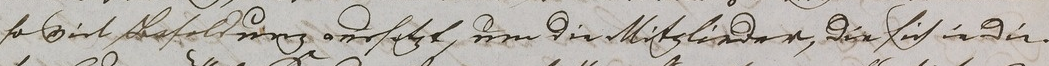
so viel Besoldung aussetzt, um die Mitglieder, die sich in die-
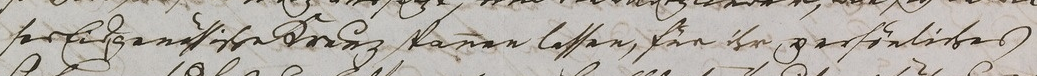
ses Eidgenössische Kreuz spannen lassen, für ihr persönliches
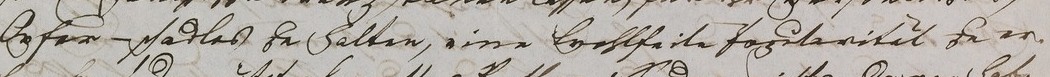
Opfer – schadlos zu halten, eine wohlfeile Popularität zu er-
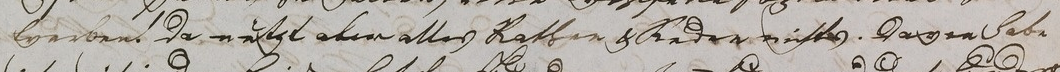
werben! Da nützt aber alles Rathen & Reden nichts. Davon habe
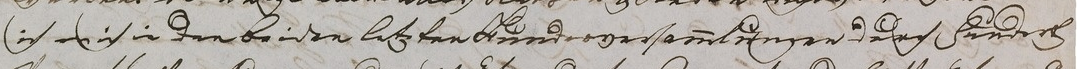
ich mich in den beiden letzten Bundesversammlungen durch hundert
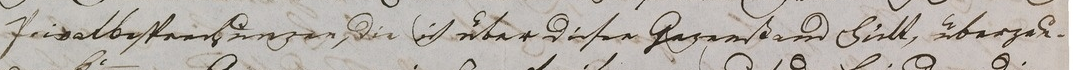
Privatbesprechungen, die ich über diesen Gegenstand hielt, überzeu-
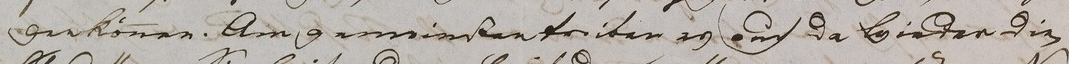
gen können. Am gemeinsten treiben es auch da wieder die
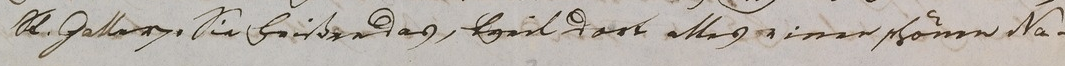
St. Galler. Sie heißen das, weil dort alles einen schönen Na-
